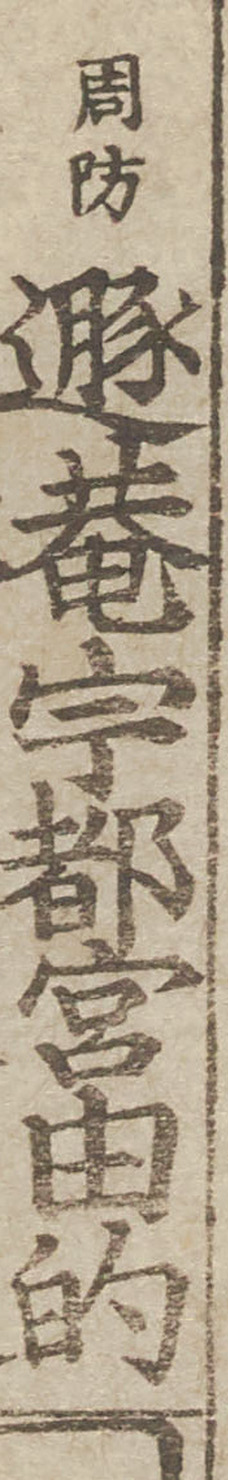同周防遯菴宇都宮由的
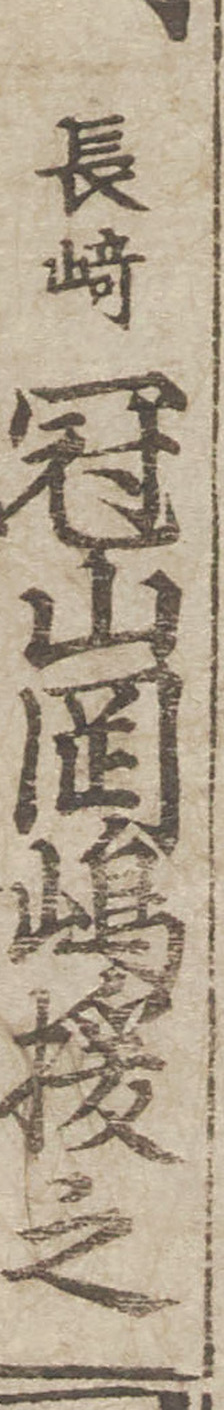同長崎冠山岡嶋援之
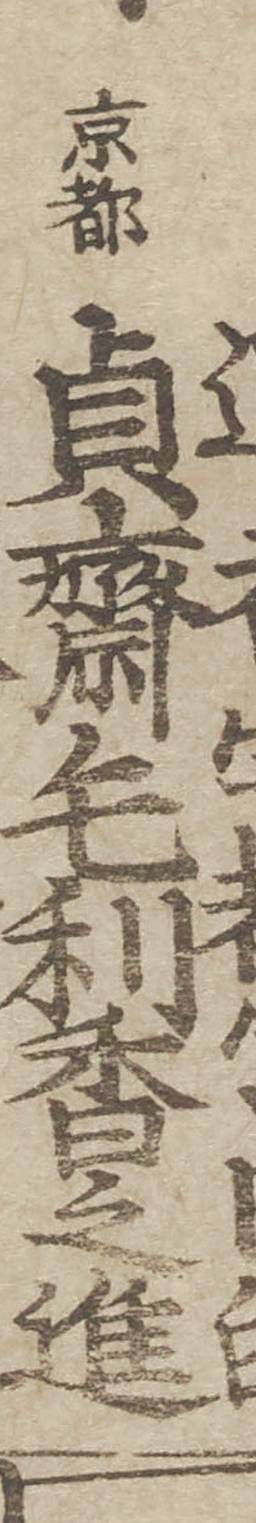同京都貞斎毛利香之進
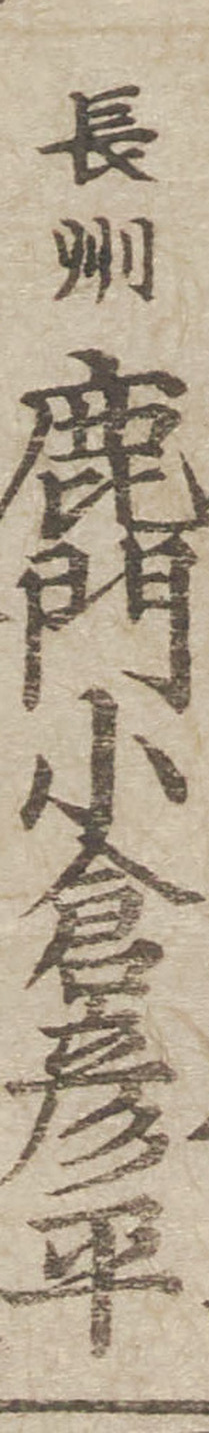同長州鹿門小倉彦平
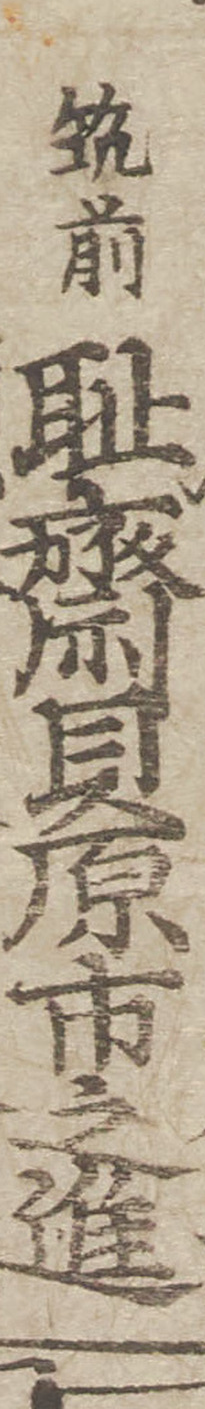同筑前耻斎貝原市之進
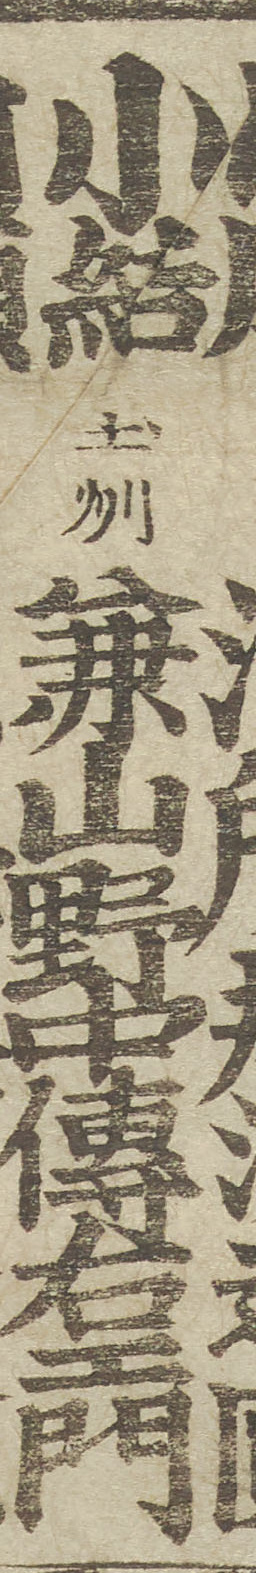小結土州兼山野中傳右エ門
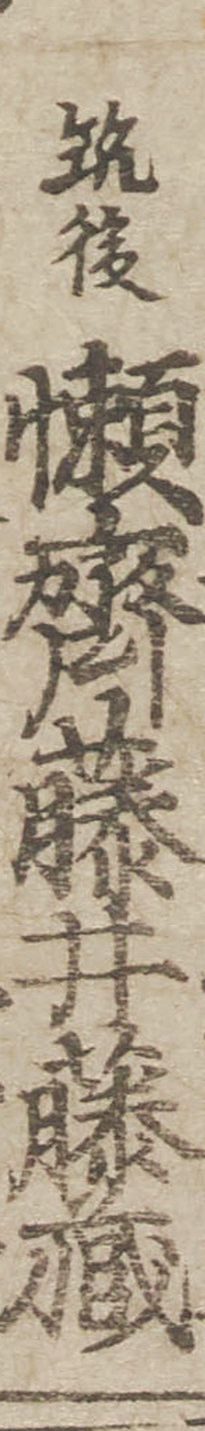同筑後懶斎藤井藤蔵
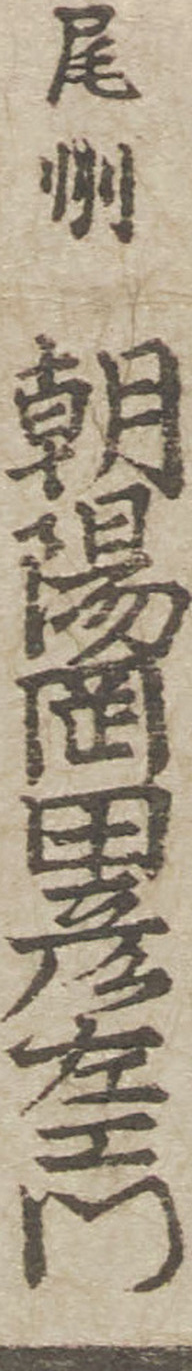同尾州朝暘岡田彦左エ門
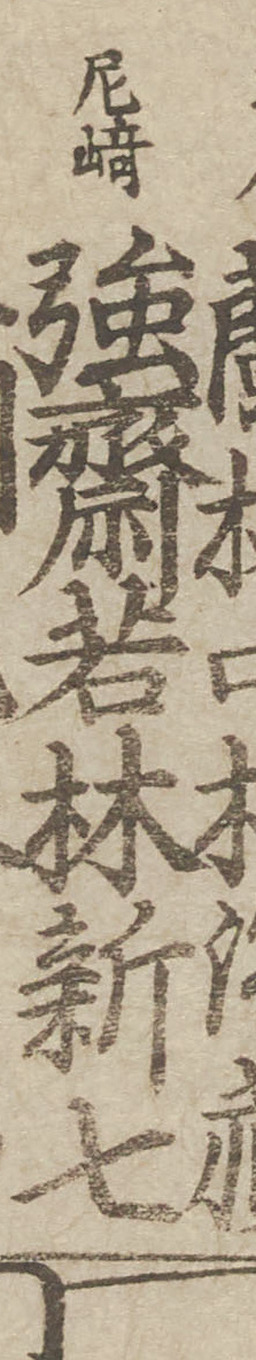同尼崎強斎若林新七
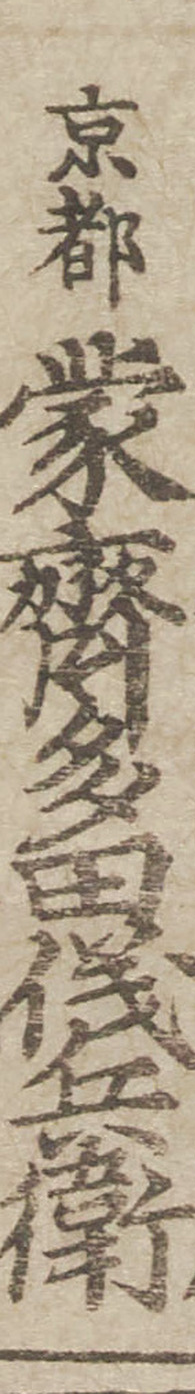同京都蒙斎多田儀兵衛
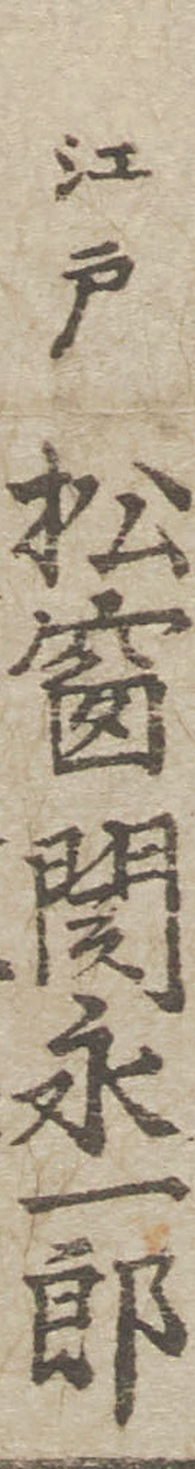同江戸松窗関永一郎
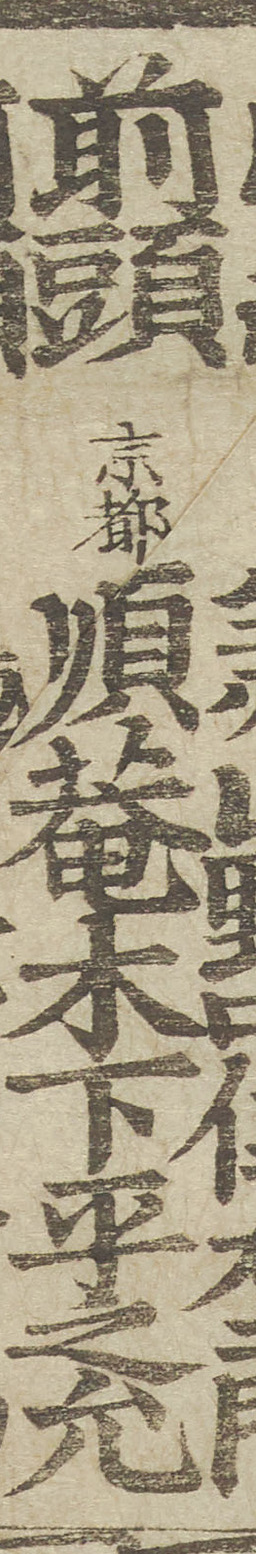前頭京都順菴木下平之允
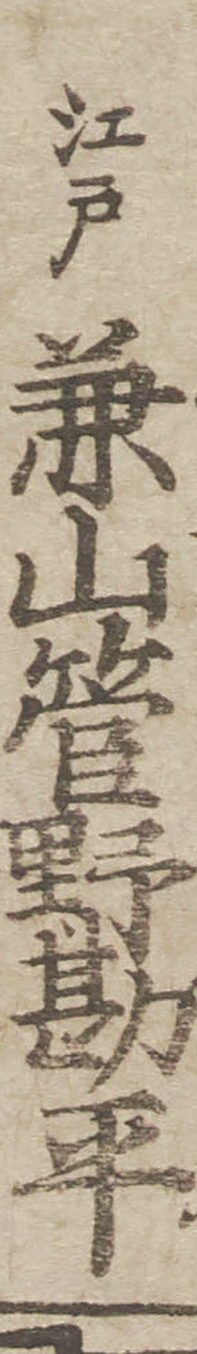同江戸兼山管野勘平
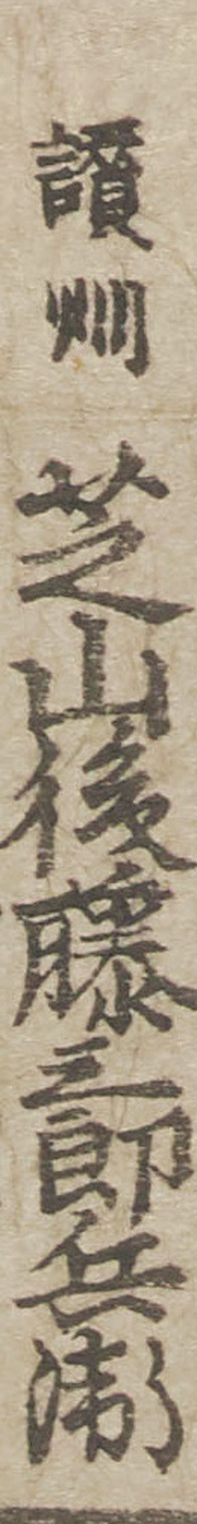同讃州芝山後藤三郎兵衛
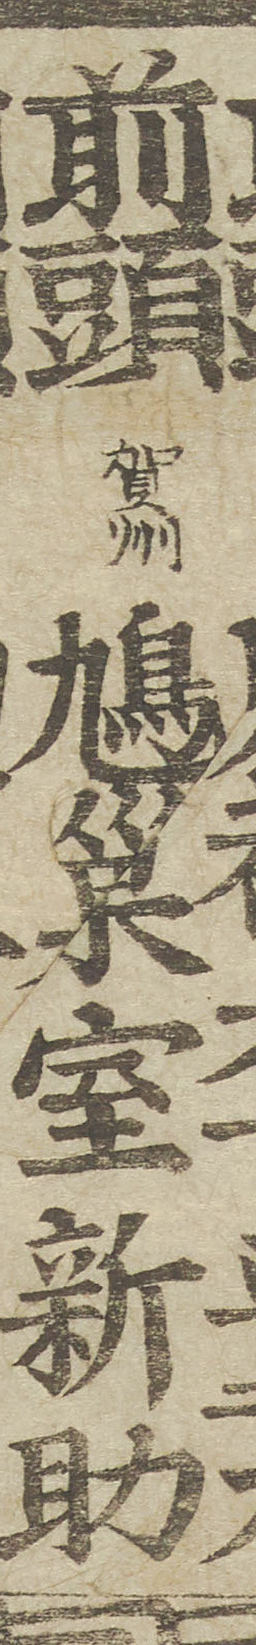前頭賀州鳩巣室新助
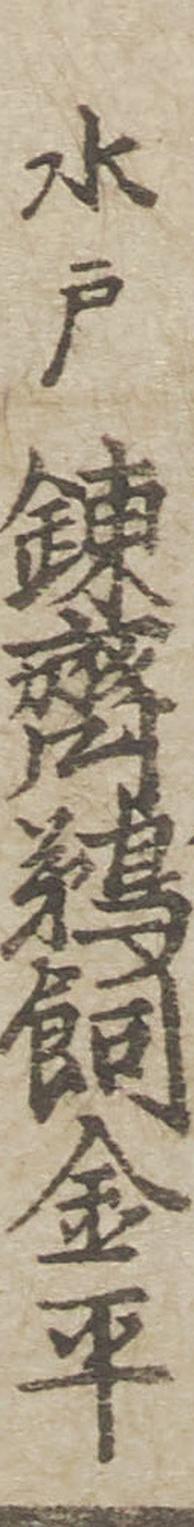同水戸錬斎鵜飼金平
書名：儒者競
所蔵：東京大学総合図書館 General Library in the University of Tokyo, JAPAN
